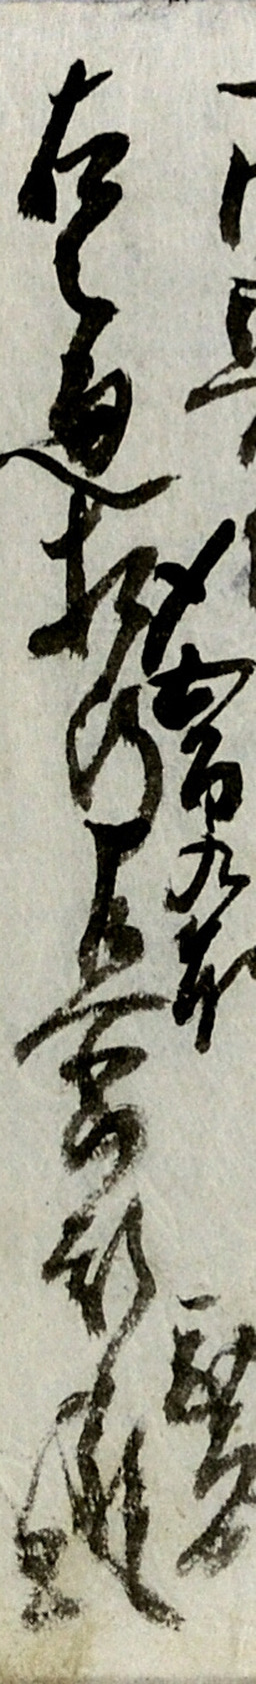右之通相改申候所如斯御座候以上
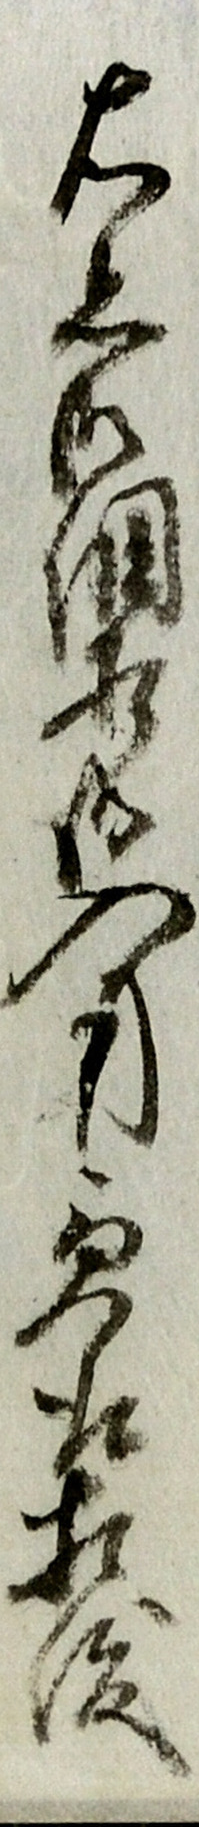右は御網打御入用受取相渡
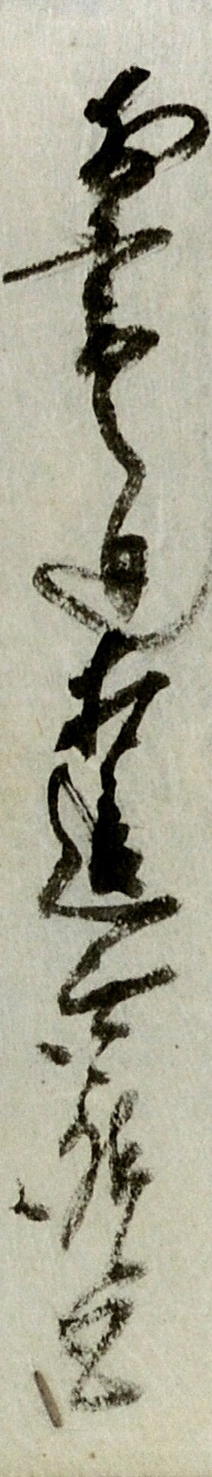別書之通相違無御座候以上

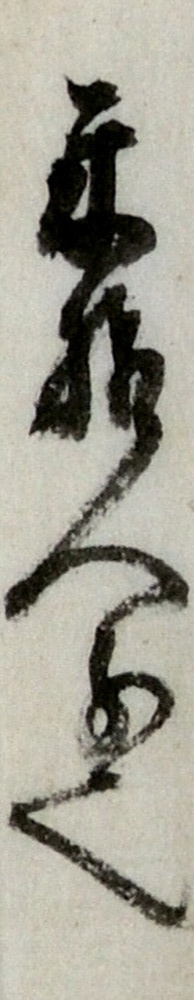米拾人分也
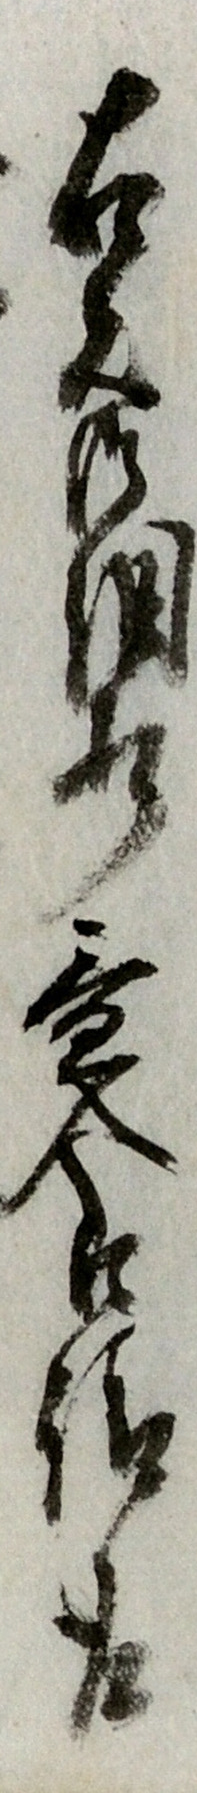右は御網打昼食請取
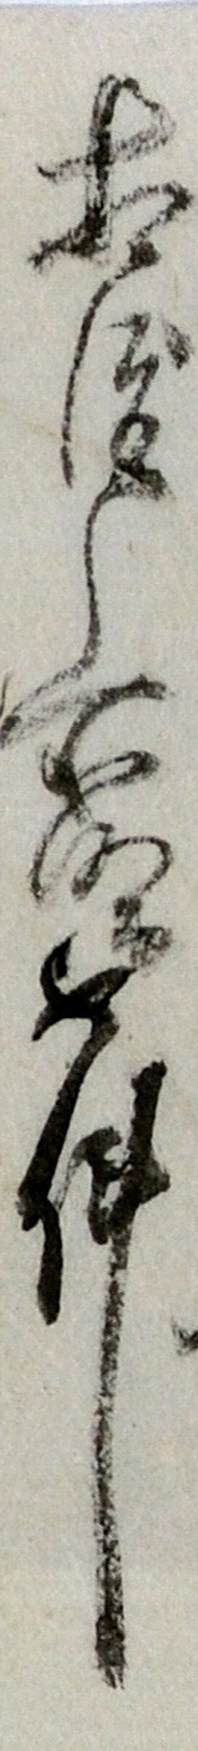相渡申所仍而如件
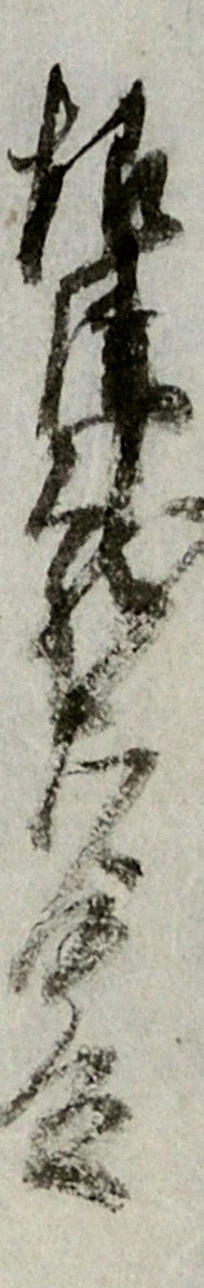根津龍右衛門殿
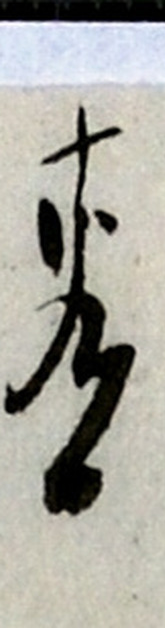廿九日
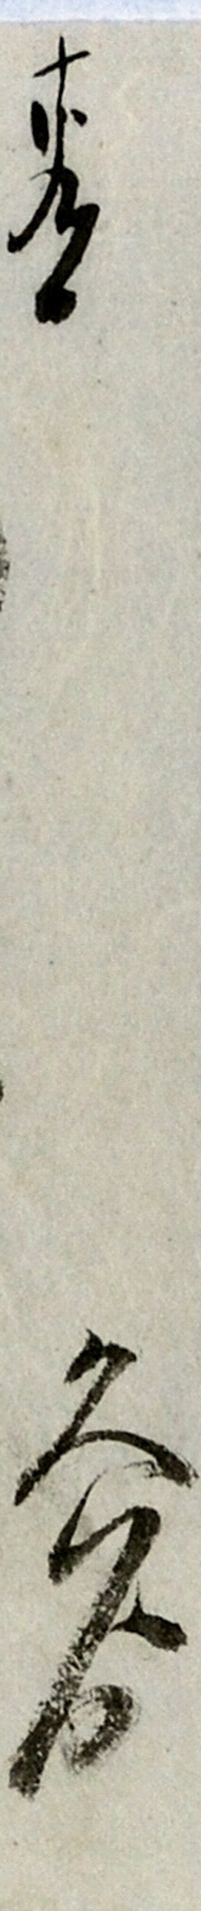廿九日
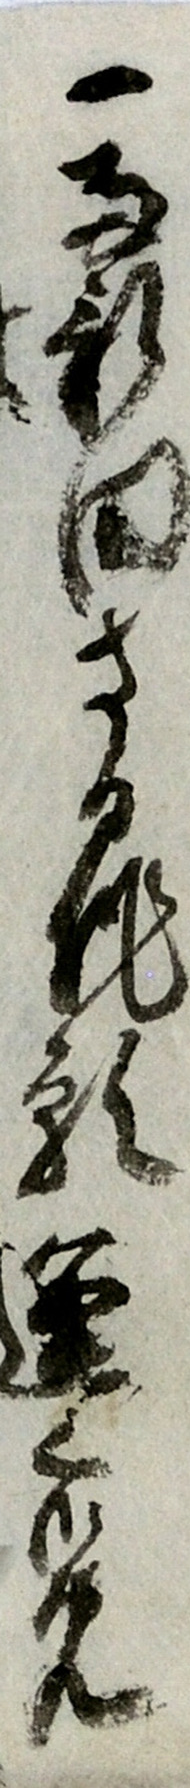一南新田さる作願運上御免
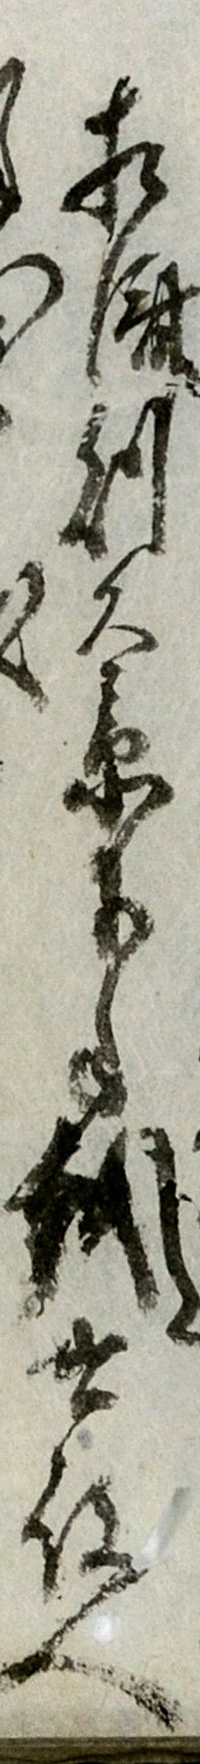相済則久兵衛下手紙書役人
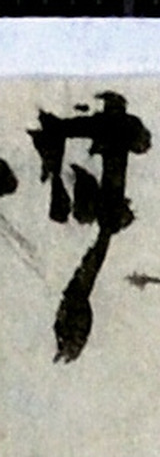廿九日
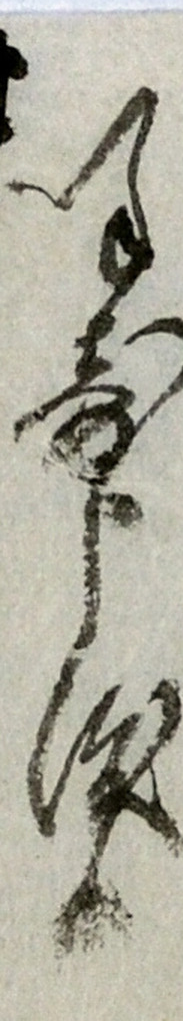呼寄申渡候
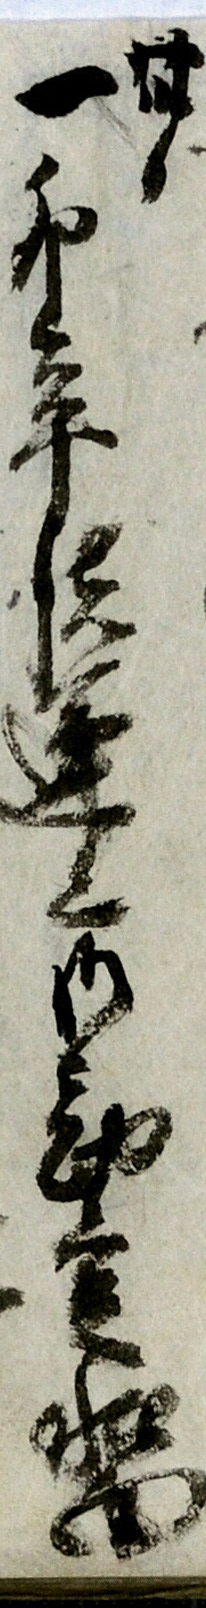一卯年諸運上御勘定帳面
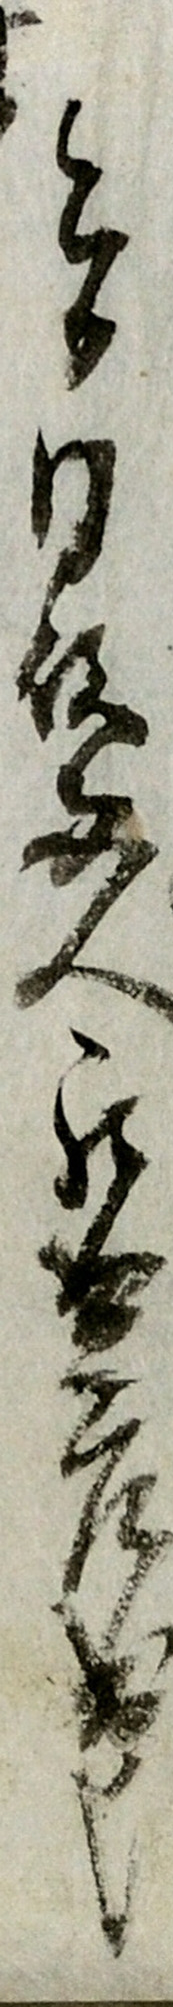今日同役両人罷出差出申候
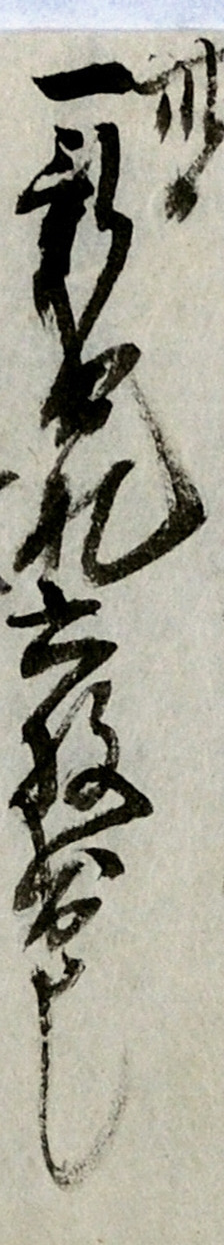一新出札六枚出申候
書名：分一方諸事御用留帳
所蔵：伊那市立高遠町図書館・合同会社AMANE
